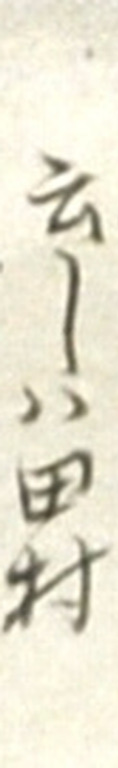云しは田村
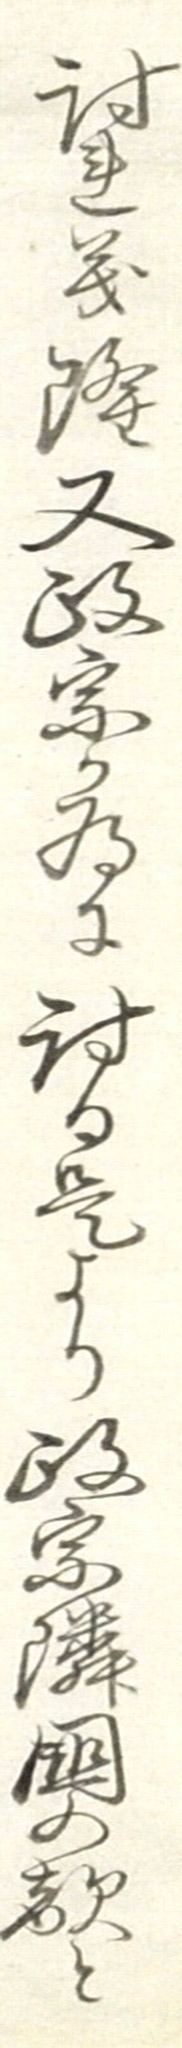討れ義隆又政宗か為に討る是より政宗隣国の敵と
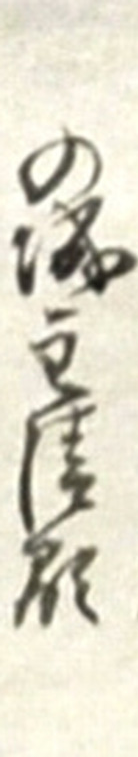の城主清顕
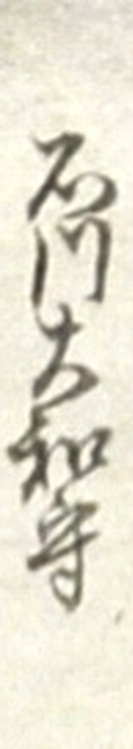石川大和守
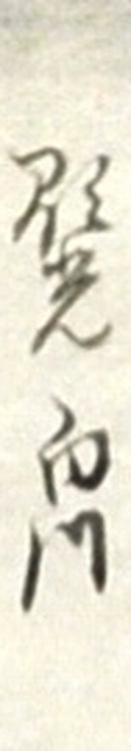顕光白川
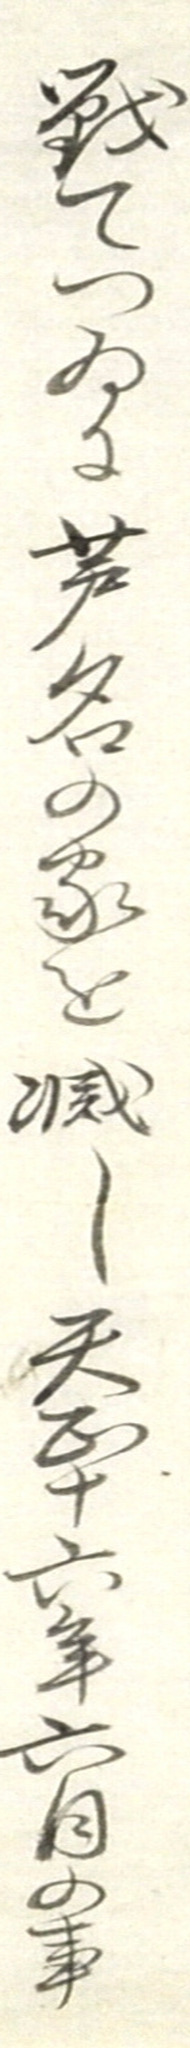戦てつゐに蘆名の家を滅し天正十六年六月の事
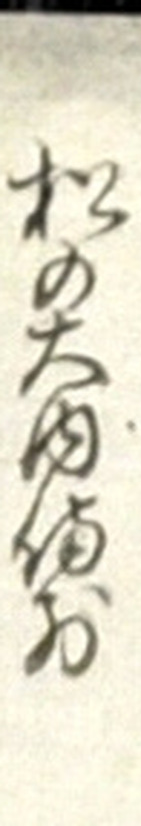松の大内備前
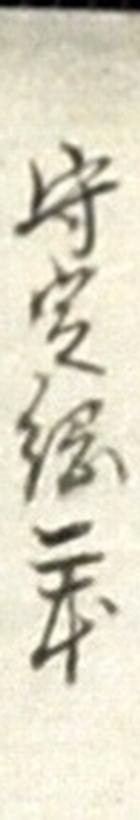守定綱二本
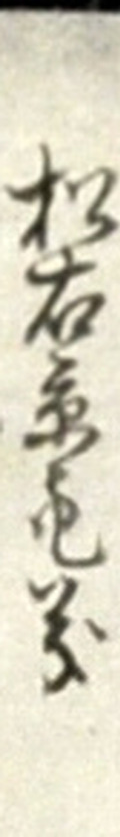松右京亮義
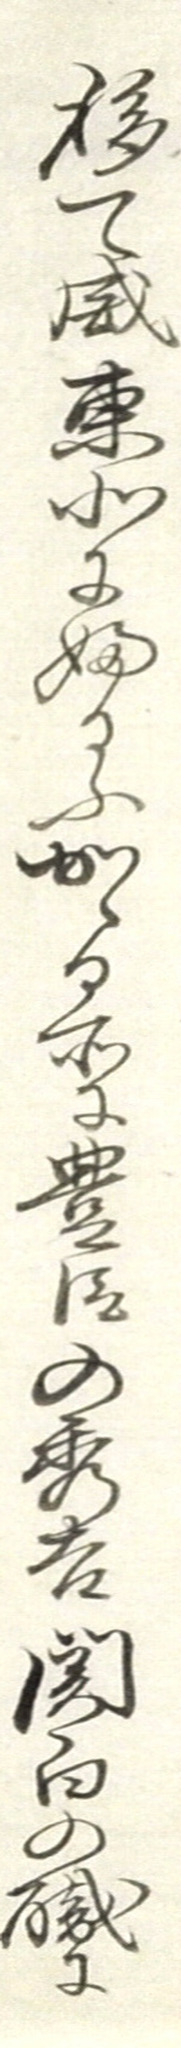移て威東北にふるふかゝる所に豊臣の秀吉関白の職に
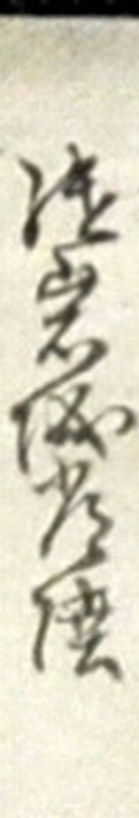継岩城常陸
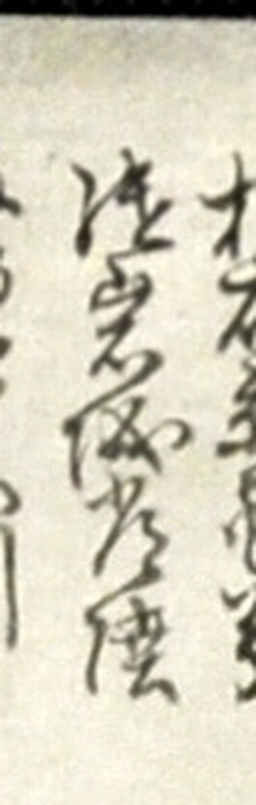継岩城常陸
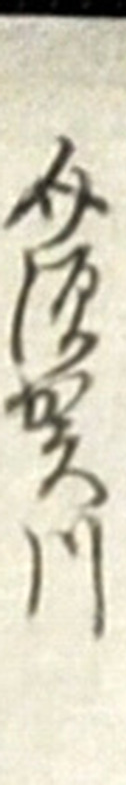介須賀川
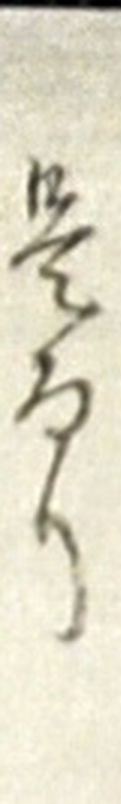是なり
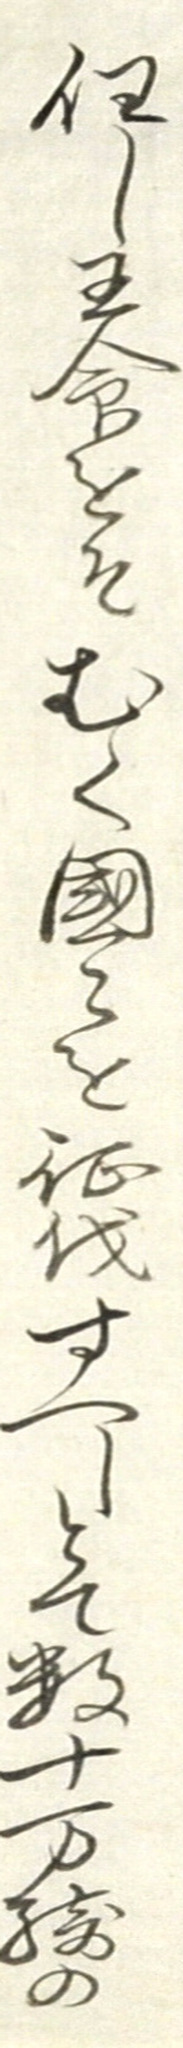任し王命をそむく国々を征伐すへしとて数十万騎の
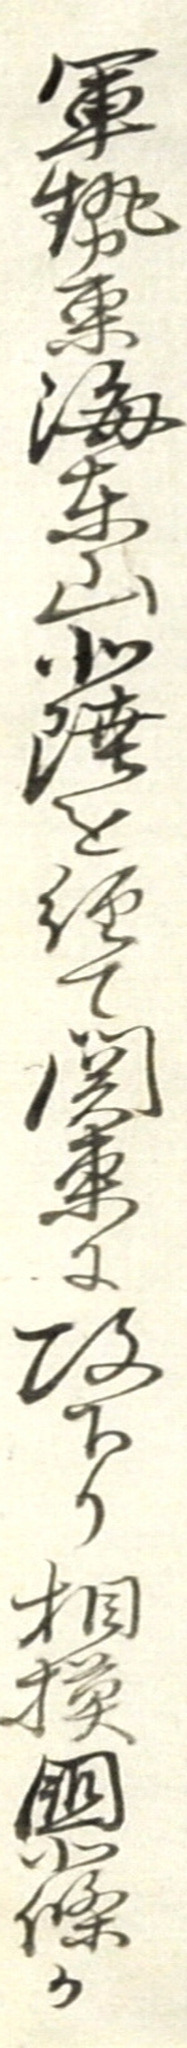軍勢東海東山北陸を経て関東に攻下り相模国北条か
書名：藩翰譜（七・下）
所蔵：伊那市立高遠町図書館・合同会社AMANE
